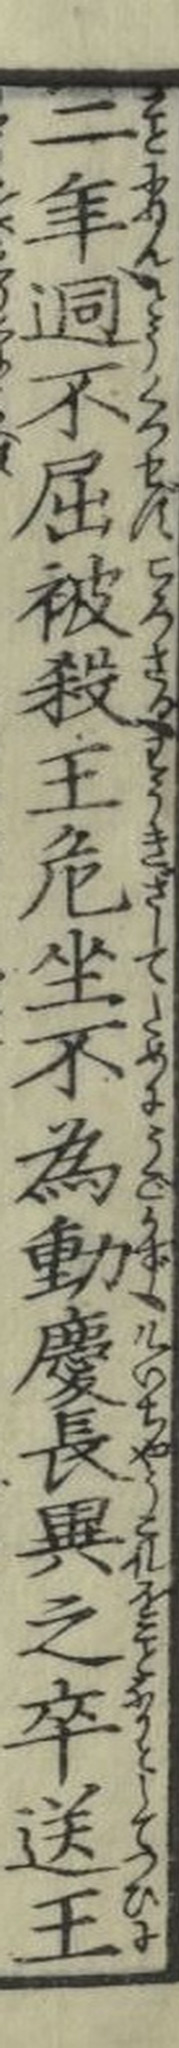二年、迵不屈被殺、王危坐不為動、慶長異之卒送王
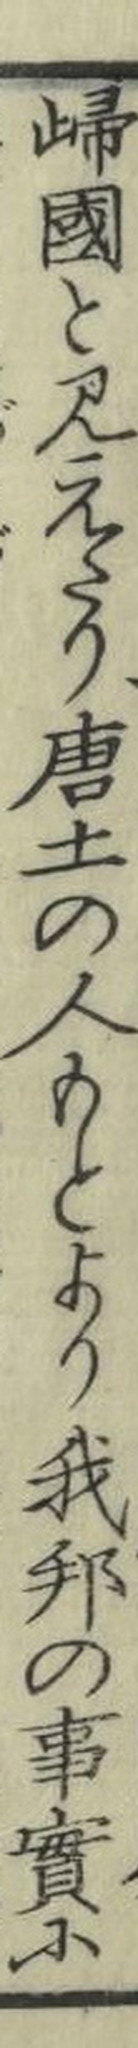帰国と見えたり、唐土の人もとより我邦の事実に
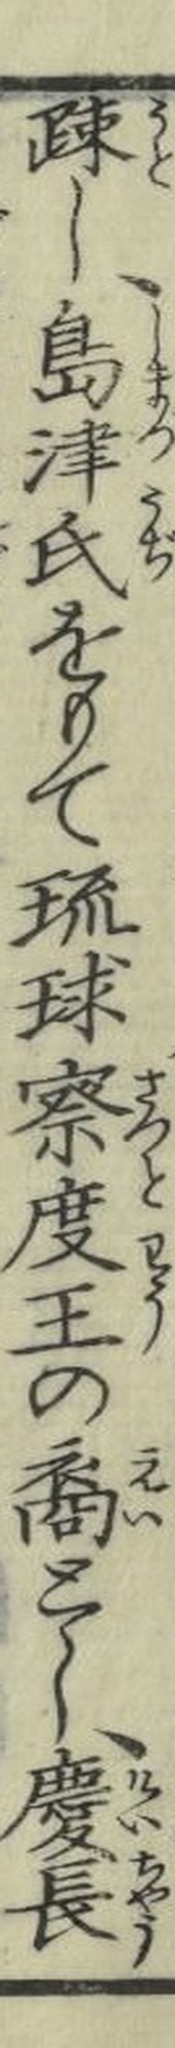疎し、島津氏をもて琉球察度王の裔とし、慶長
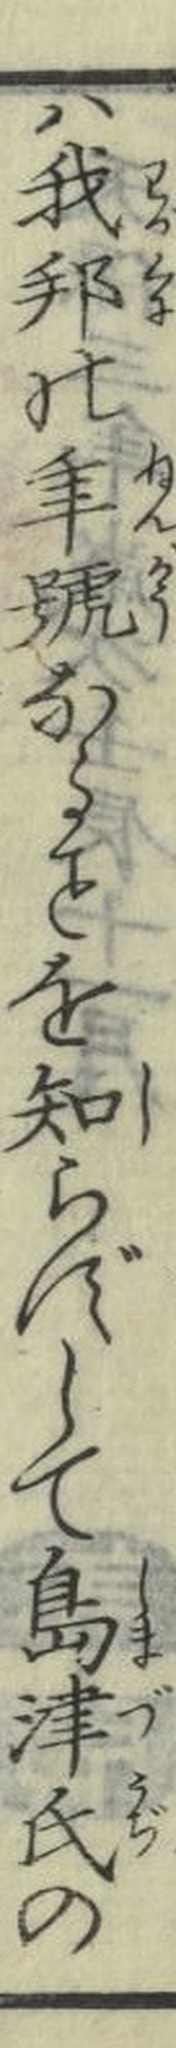は我邦の年号なることを知らずして島津氏の
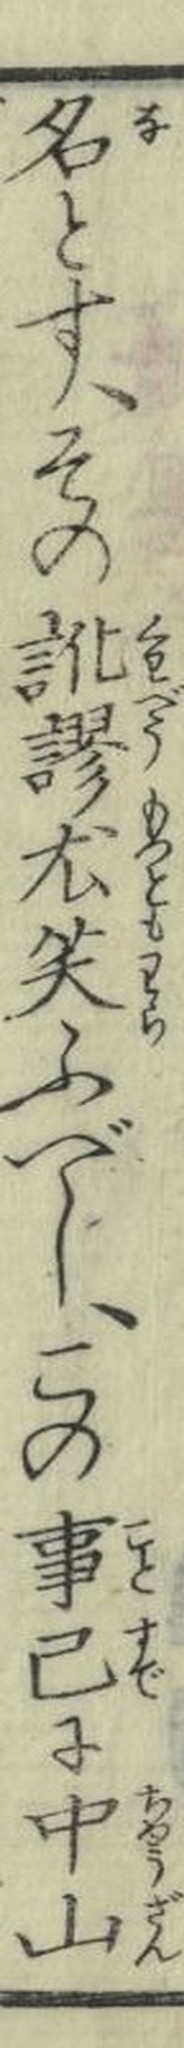名とす、その訛謬尤笑ふべし、この事已に中山
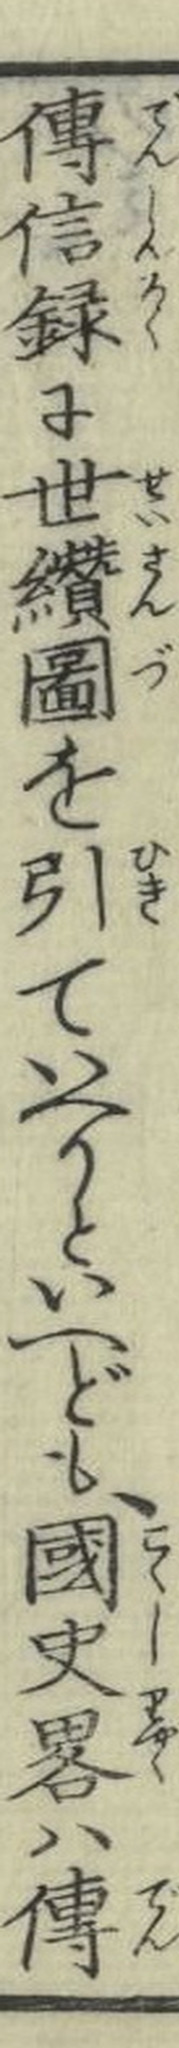伝信録に世纘図を引ていへりといへども、国史略は伝
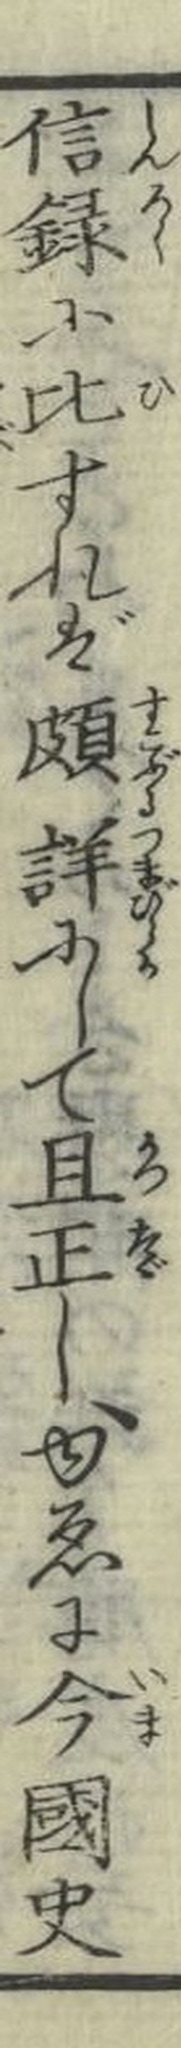信録に比すれば頗詳にして且正し、ゆゑに今国史
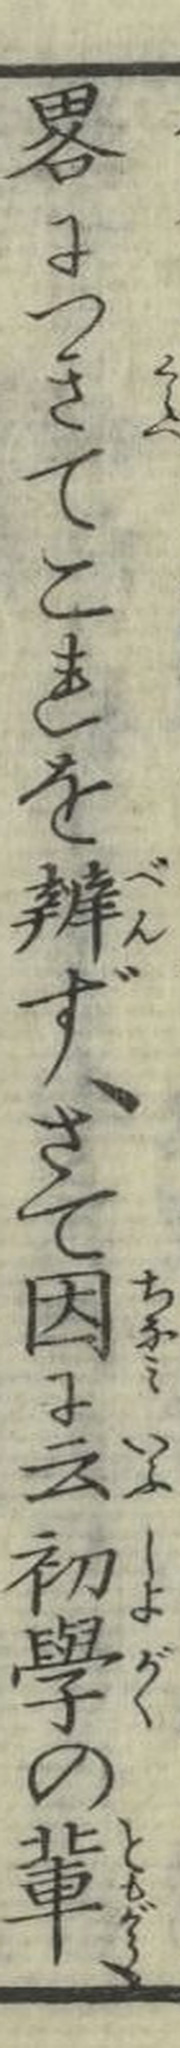略につきてこれを弁ず、さて因に云初学の輩、
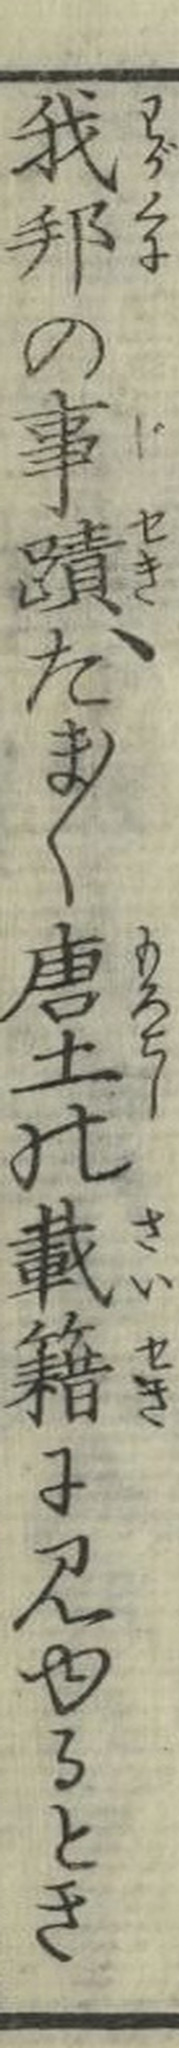我邦の事蹟たま〳〵唐土の載籍に見ゆるとき

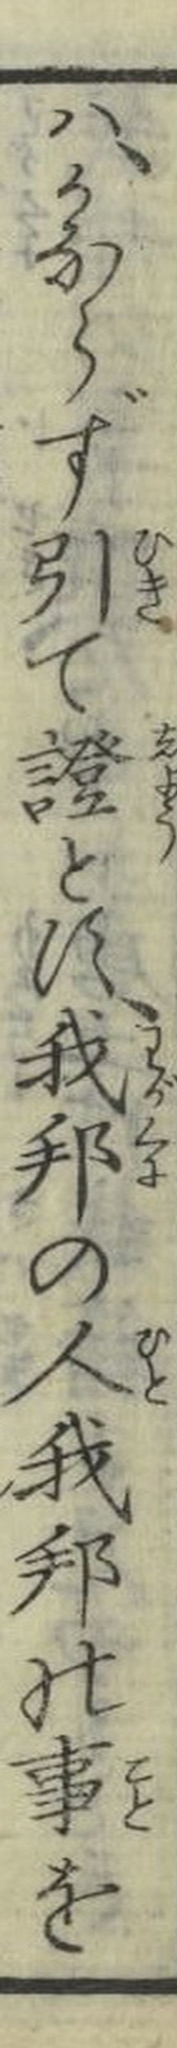は、かならず引て証とす、我邦の人我邦の事を
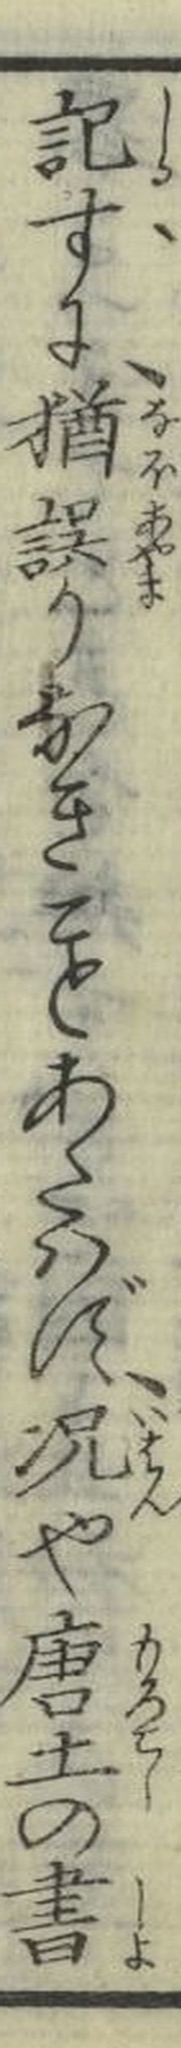記すに、猶誤りなきことあたはず、況や唐土の書
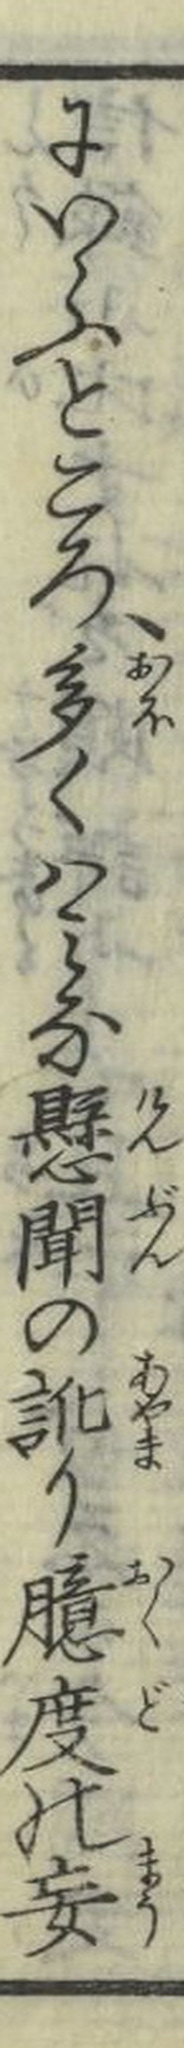にいふところ、多くはみな懸聞の訛り臆度の妄
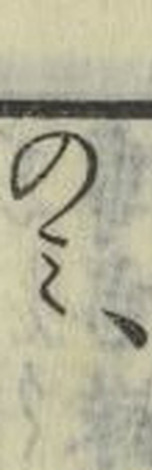のみ、
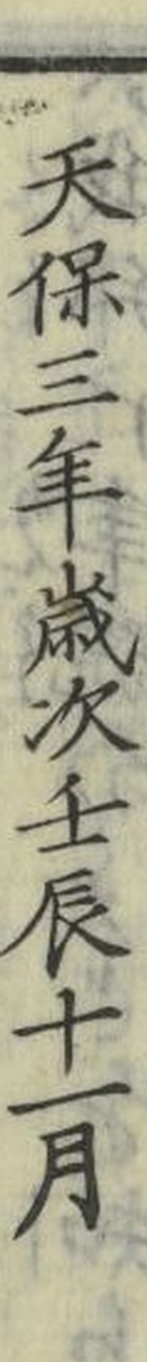天保三年歳次壬辰十一月
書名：琉球入貢紀畧
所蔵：University of the Ryukyus Library
